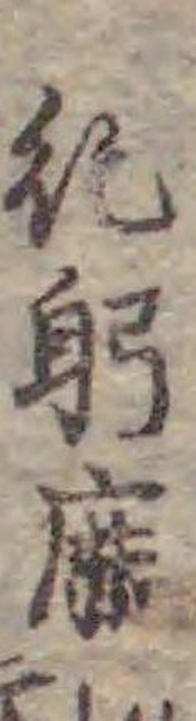紀躬鹿
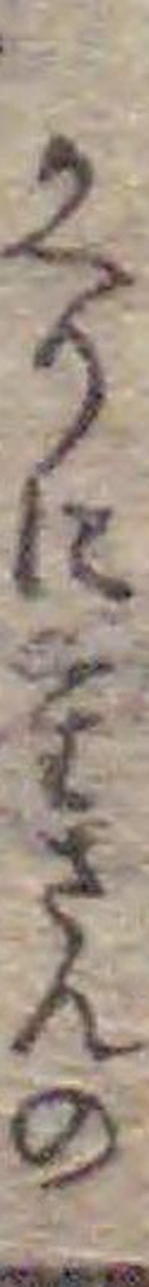かへりに重さんの
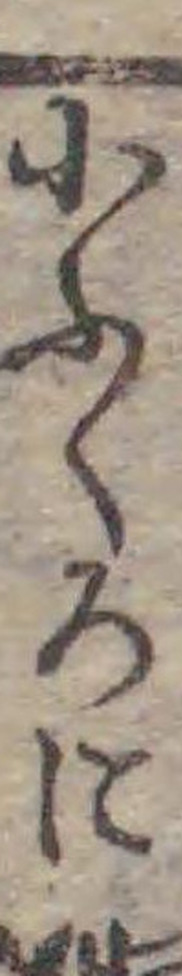小ふくろに
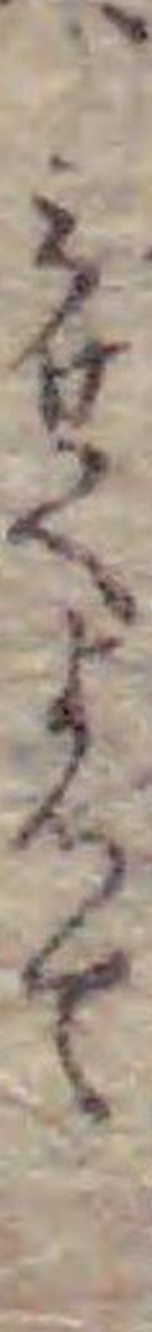みせへよつて
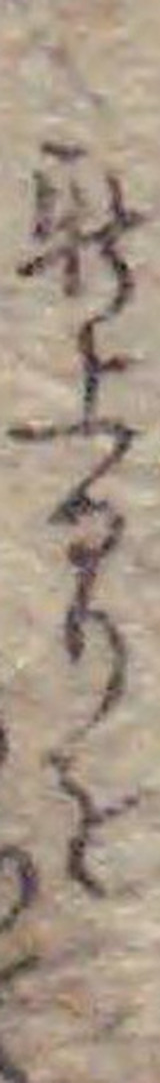新上るりを
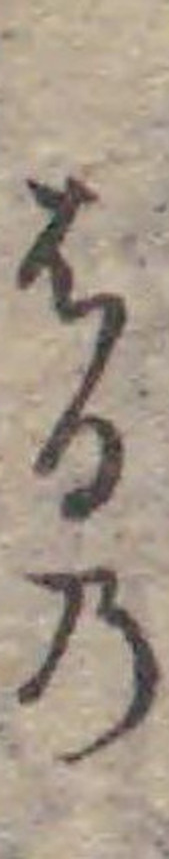はるの
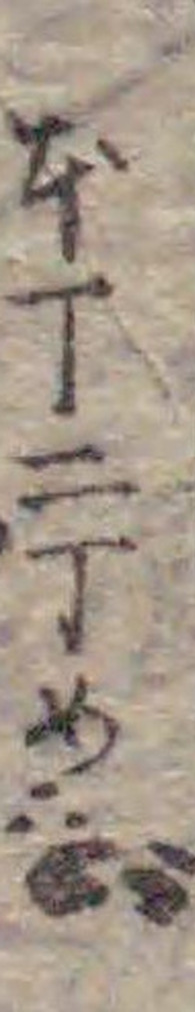本丁二丁め
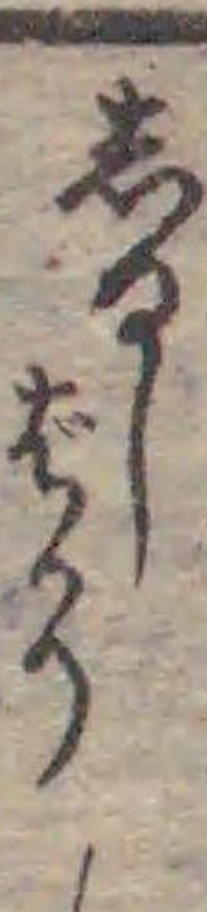しるし
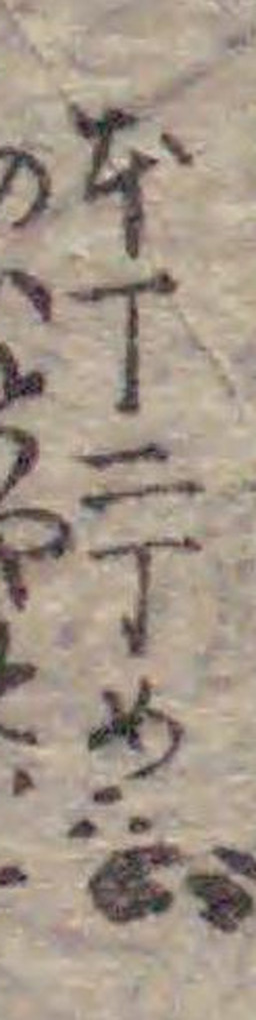本丁二丁め
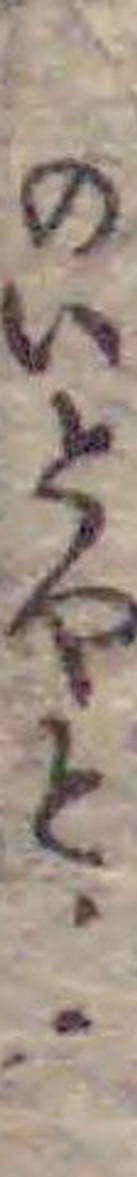のいとやと
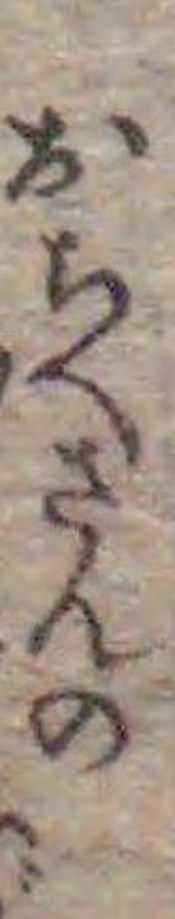おちへさんの
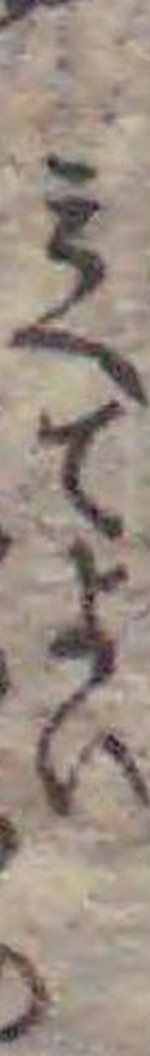みへてよい
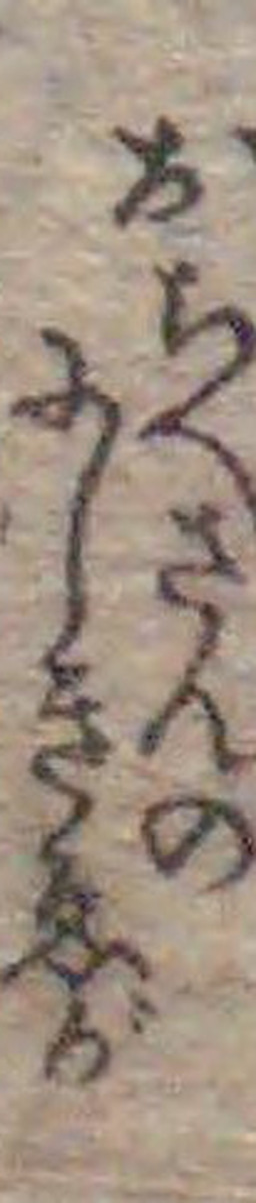にしきゑが
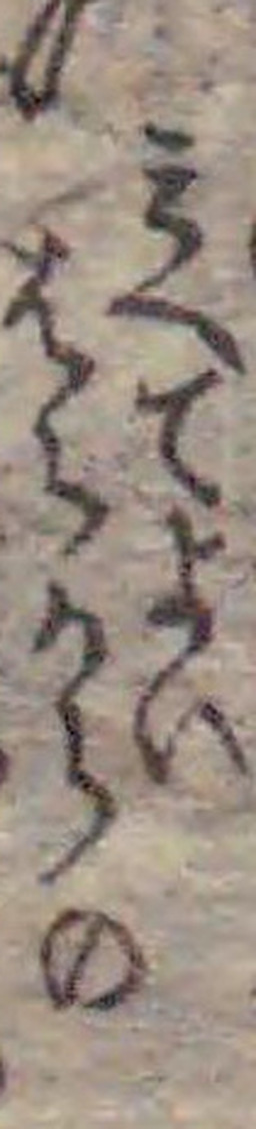はらからの
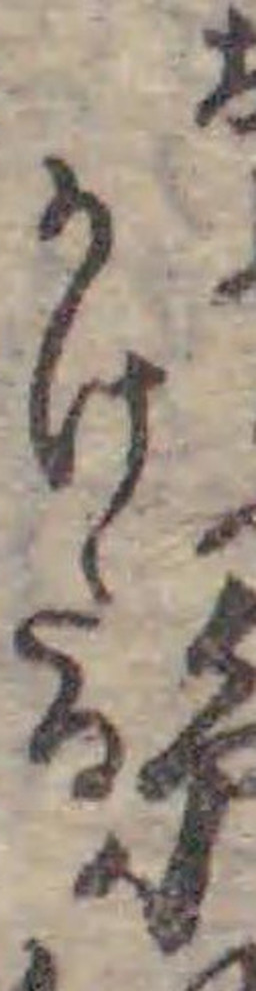かけたる
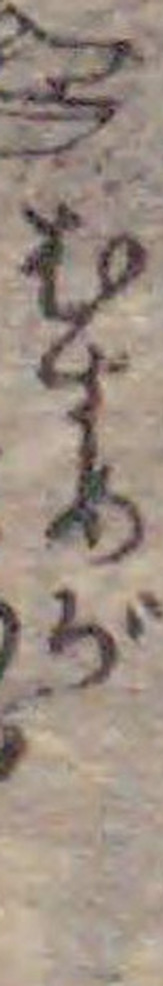むすめが
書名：年始御礼帳 : 3巻
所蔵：国立国会図書館 National Diet Library, JAPAN
